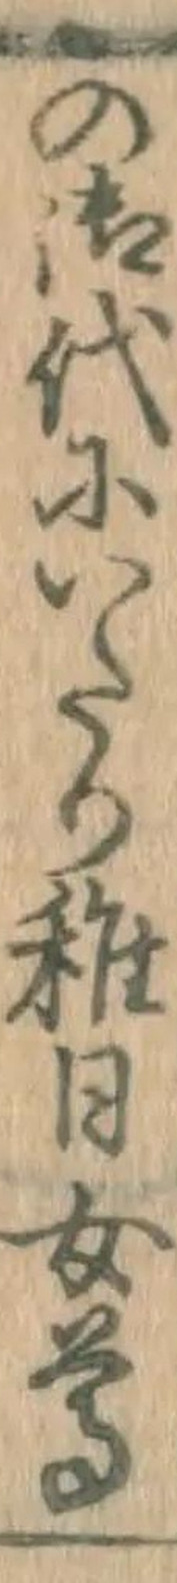の御代にいたり稚日女尊
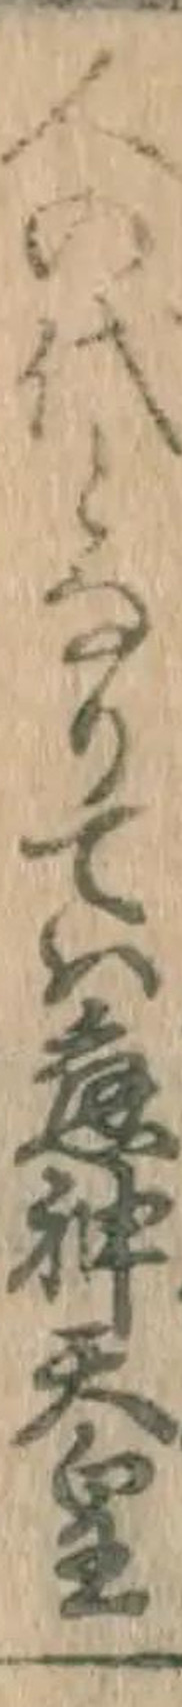人の代となりては応神天皇
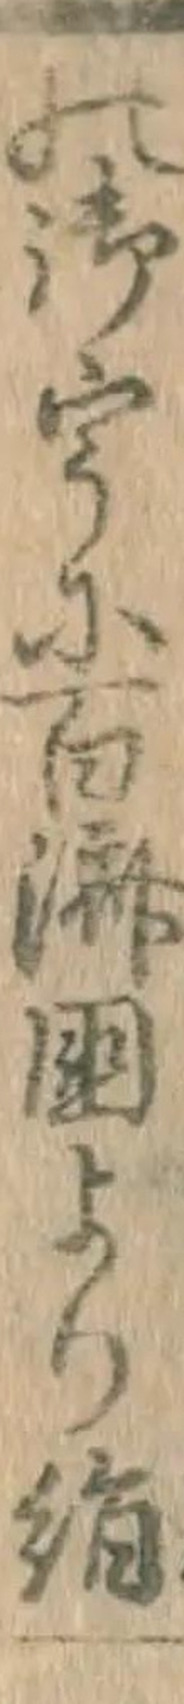の御宇に百済国より絹
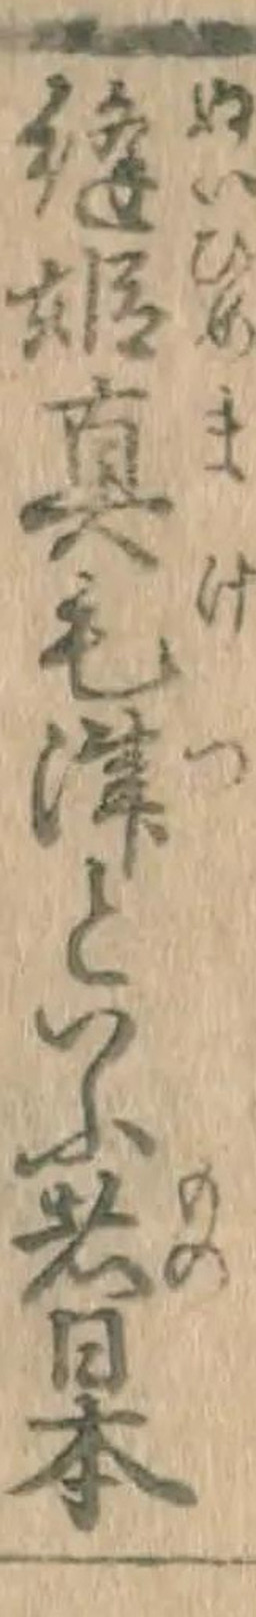縫姫真毛津といふ者日本
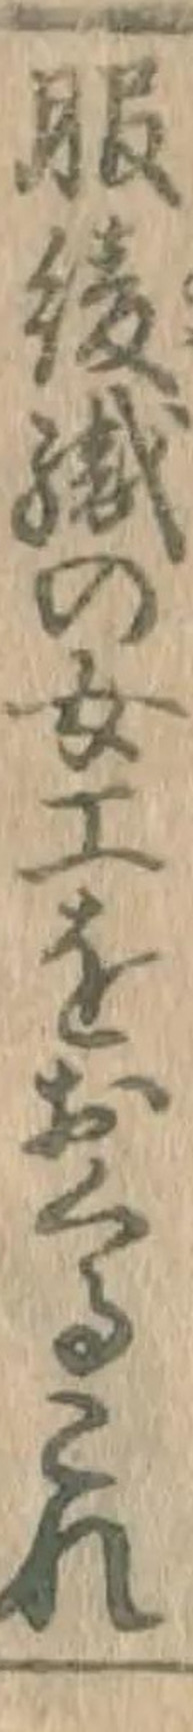服綾織の女工をおくるこれ
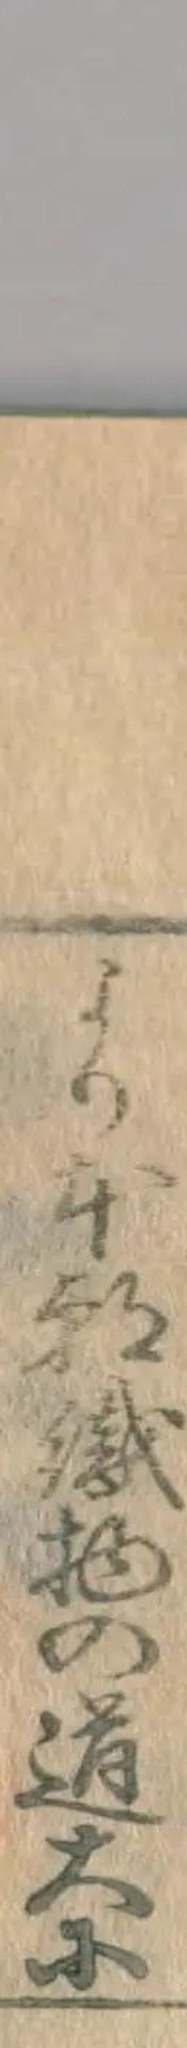より本朝織物の道大に
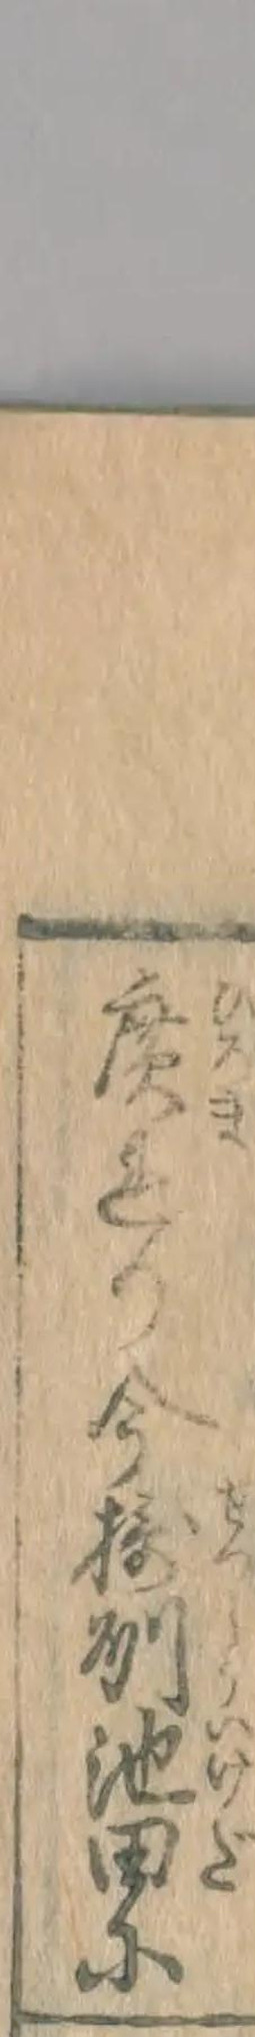広れり今摂州池田に

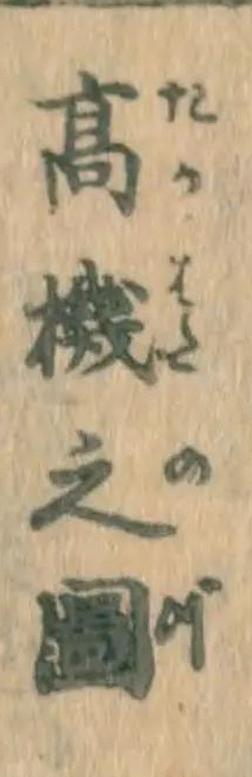髙機之図
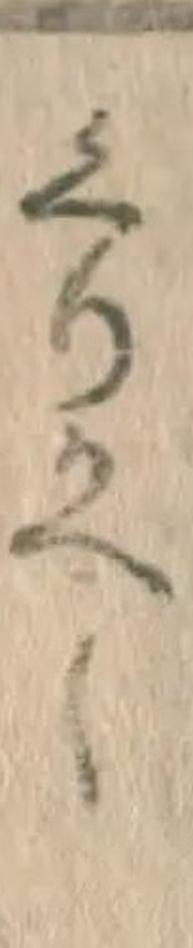くりかへし
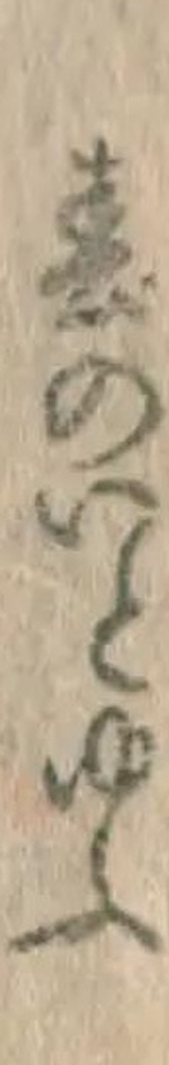春のいとゆふ
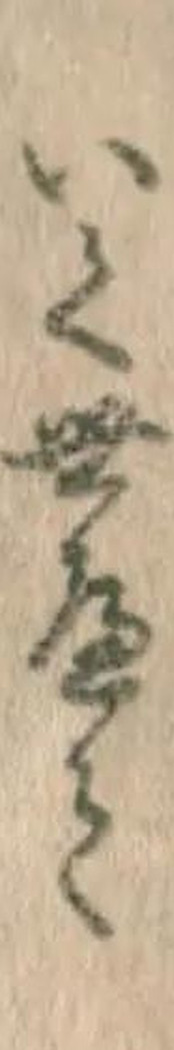いく世へて
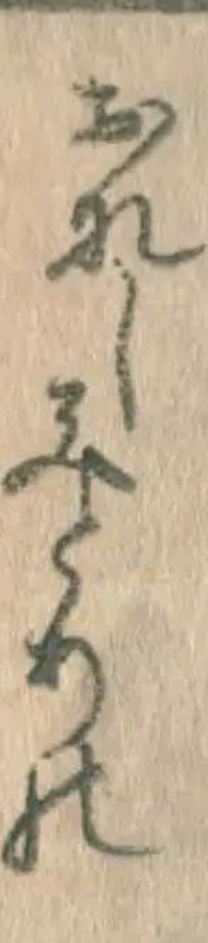おなしみとりの

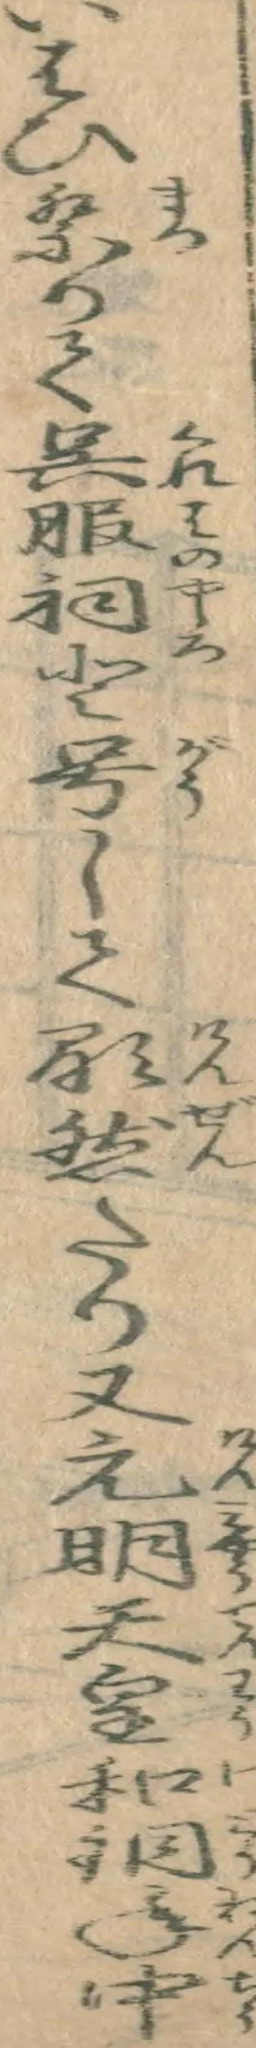いはひ祭りて呉服祠と号して顕然たり又元明天皇和銅年中
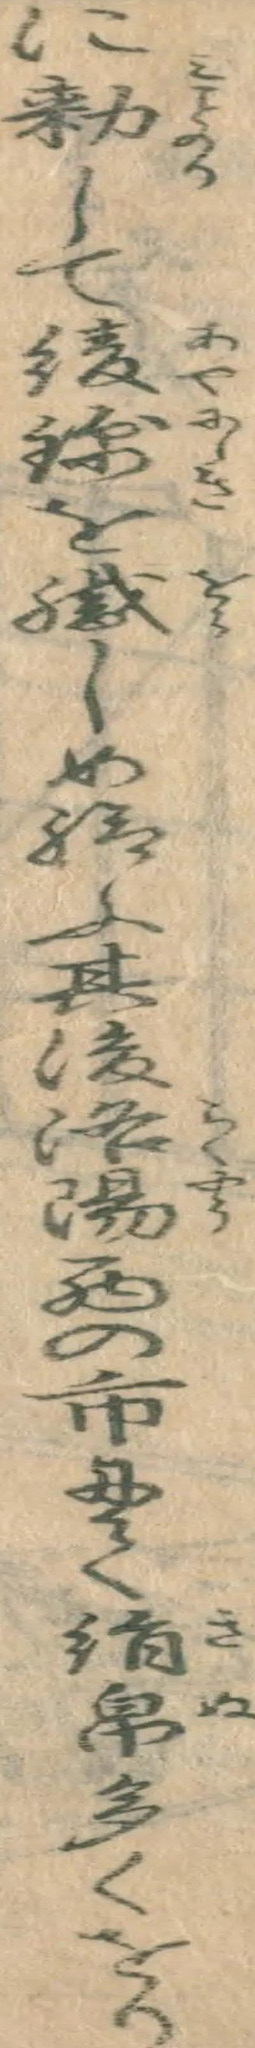に勅して綾錦を織しめ給ふ其後洛陽西の市にて絹帛多くをり
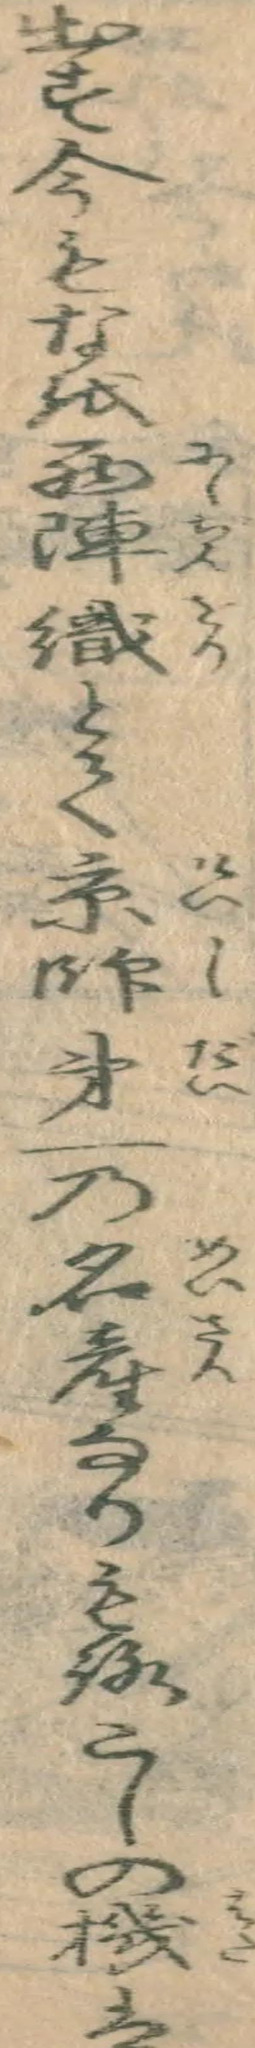出す今もなを西陣織とて京師第一の名産なりもろこしの機は
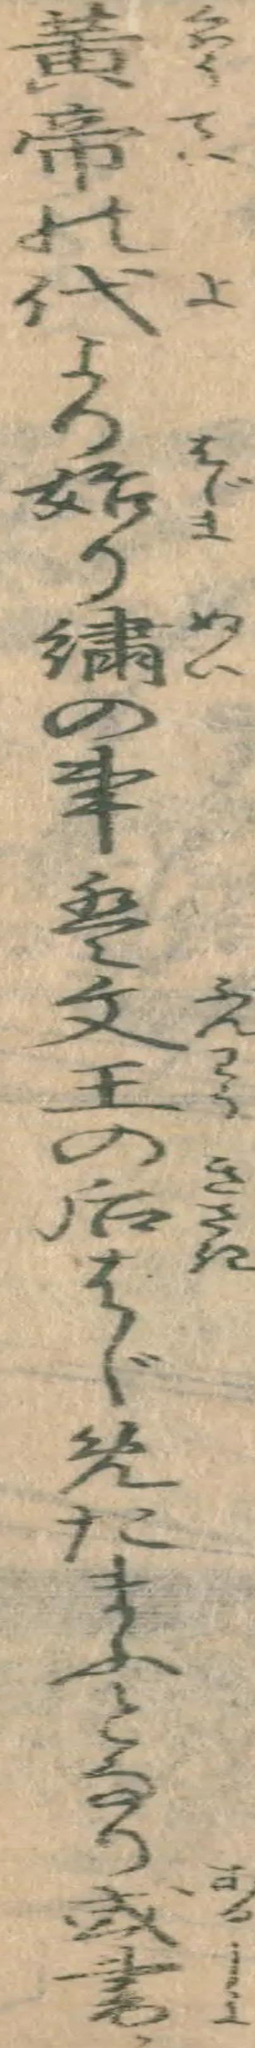黄帝の代より始り繍の事は文王の后はじめたまふとなり或書に
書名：養蚕秘録 3巻. [3]
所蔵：国立国会図書館 National Diet Library, JAPAN
